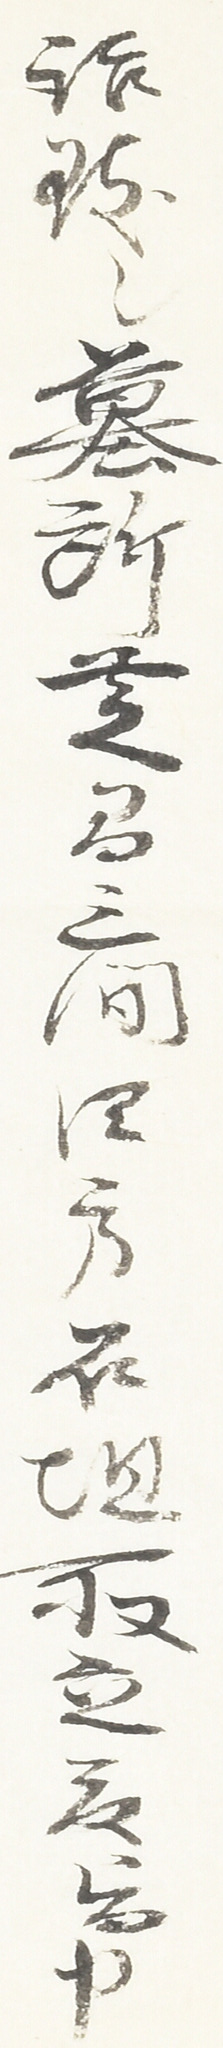話致し墓所芝間三間四方石垣取立度旨申
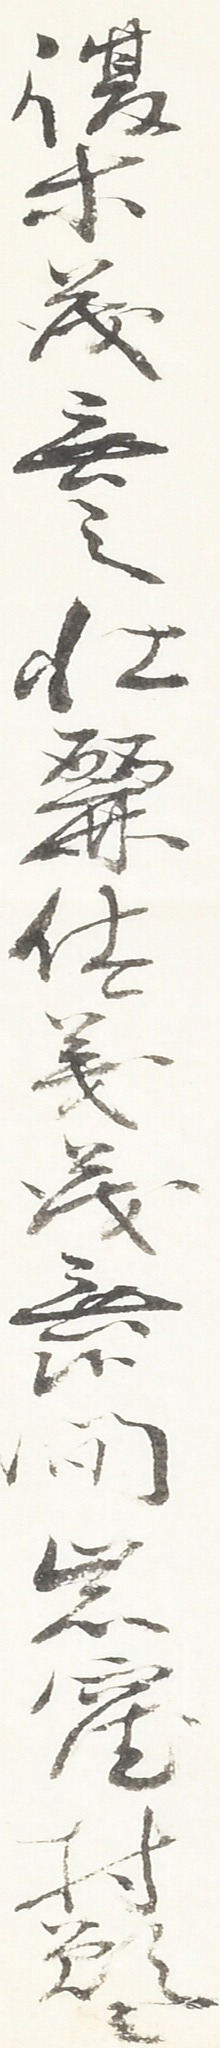覆等も無之壮麗仕候義も無候間岩窪村願之
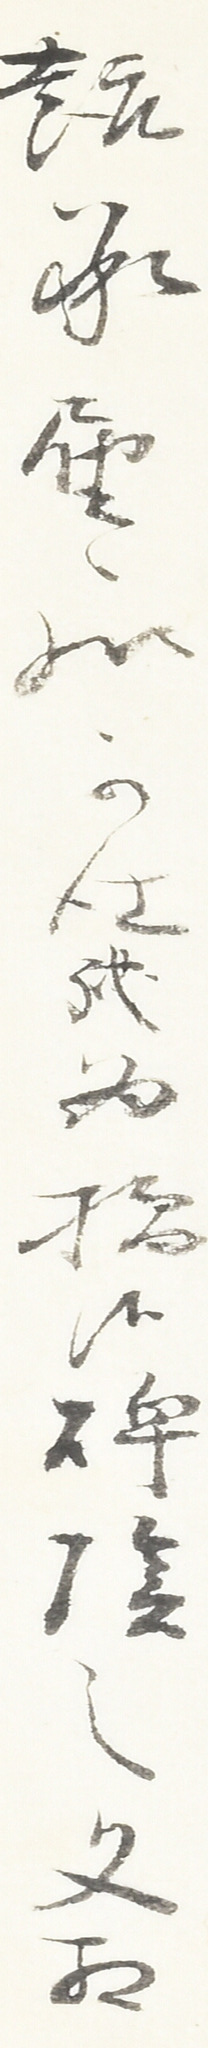趣承届候処可仕哉為摺候碑陰之文相

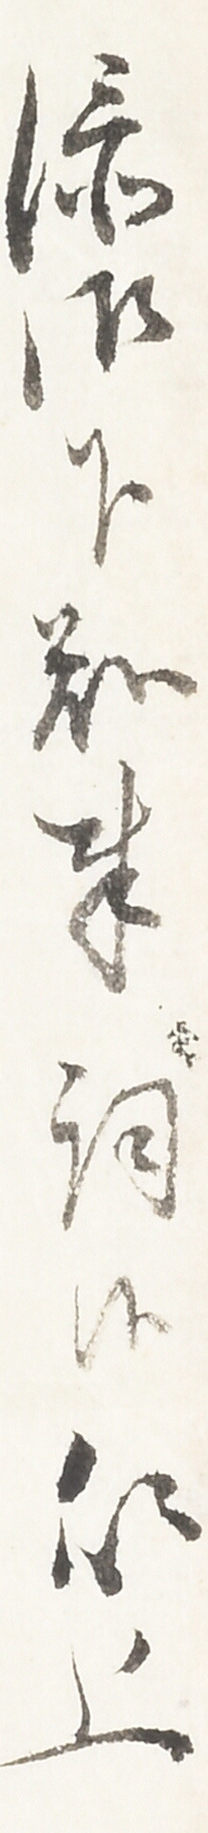添御下願奉伺候以上
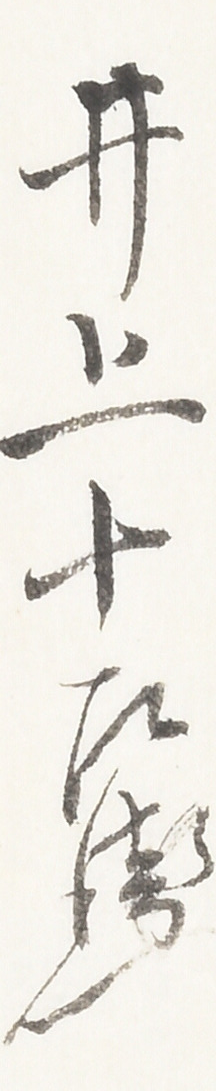井上十左衛門
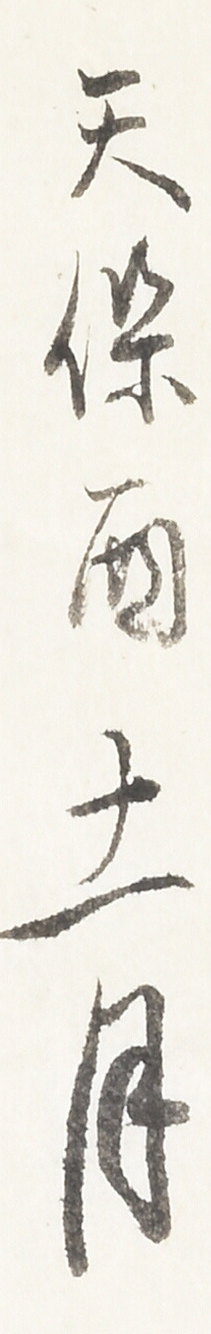天保酉十一月日
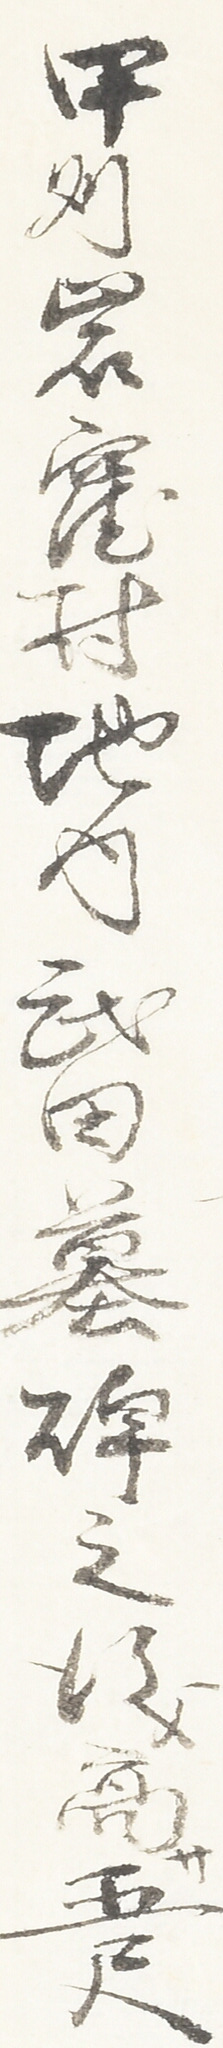甲州岩窪村地内武田墓碑之儀高サ五尺
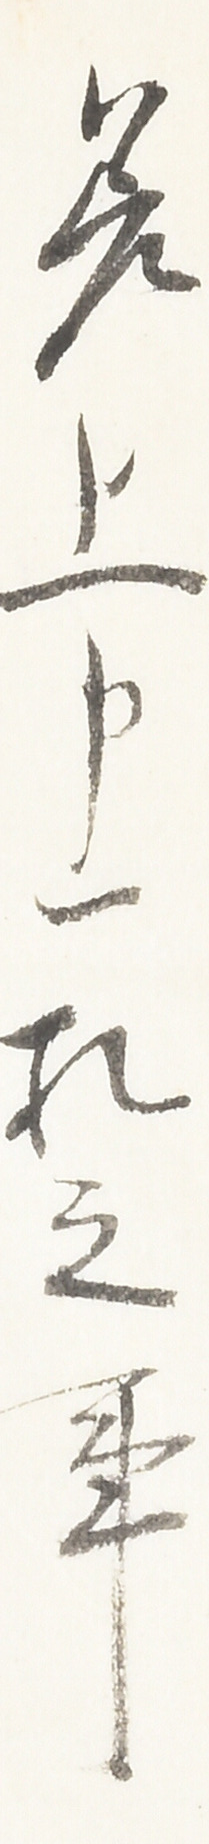差上申一札之事
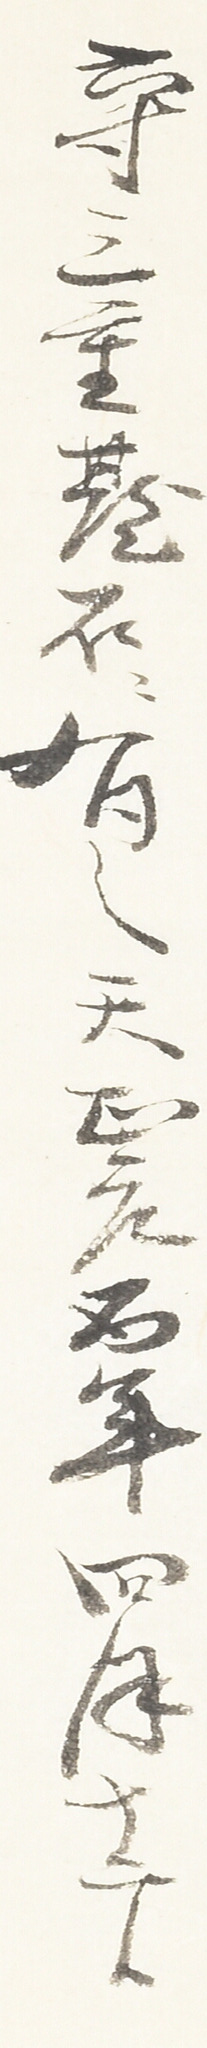六寸三重台石ニ有之天正元酉年四月十二日
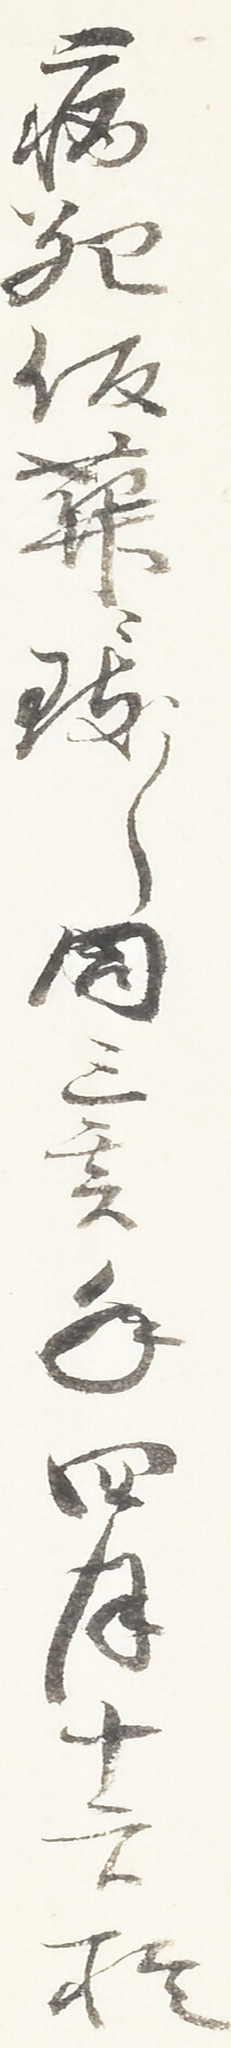病死仮葬ニ致し同三亥年四月十二日於
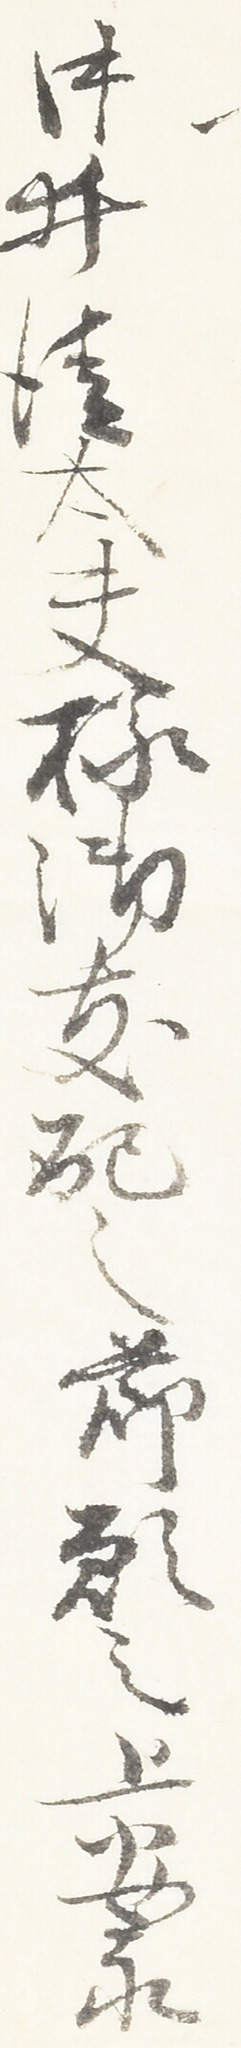中井清太夫様御支配之節願之上安永
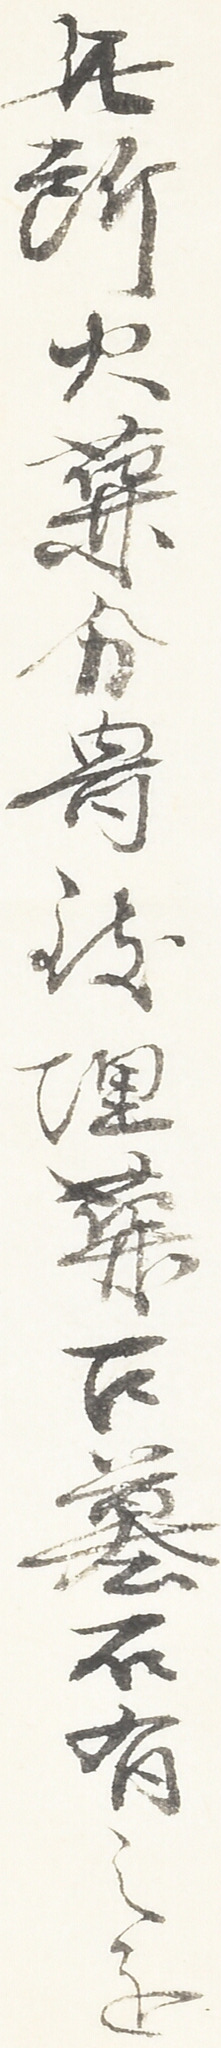此所火葬分骨致埋葬古墓石有之を
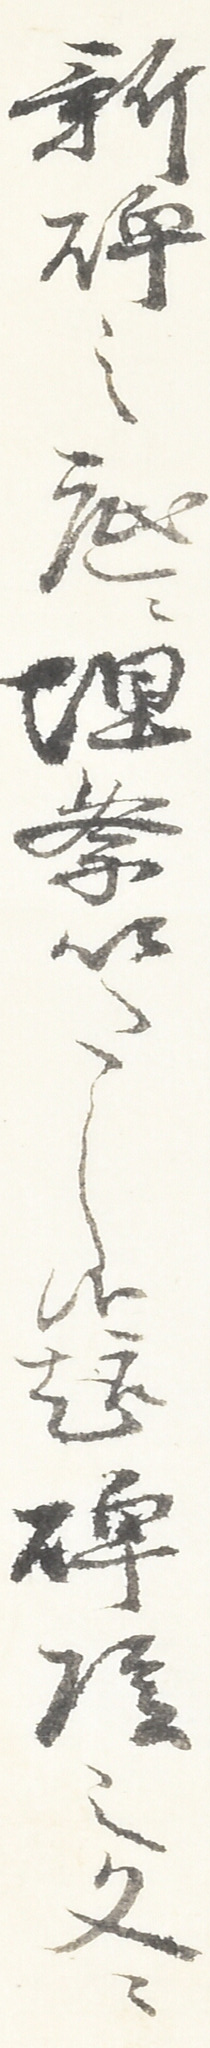新碑之底ニ埋祭いたし候趣碑陰之文ニ
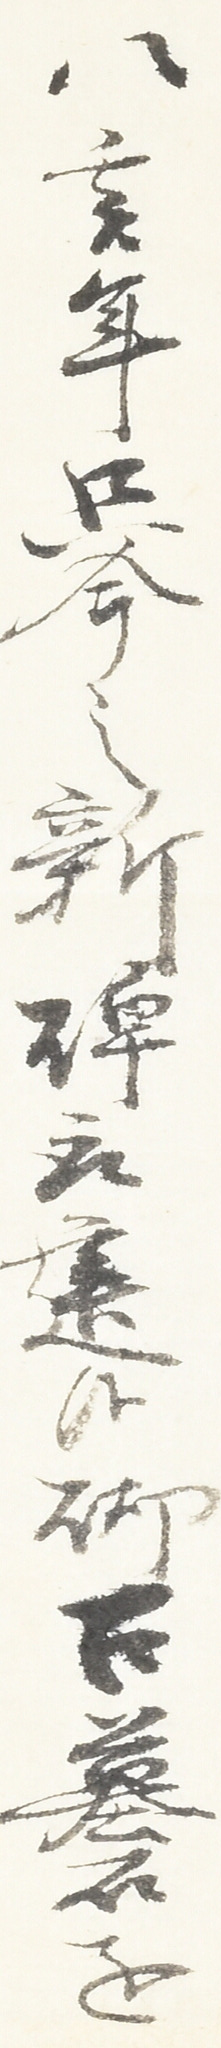八亥年只今之新碑取建候砌古墓石を

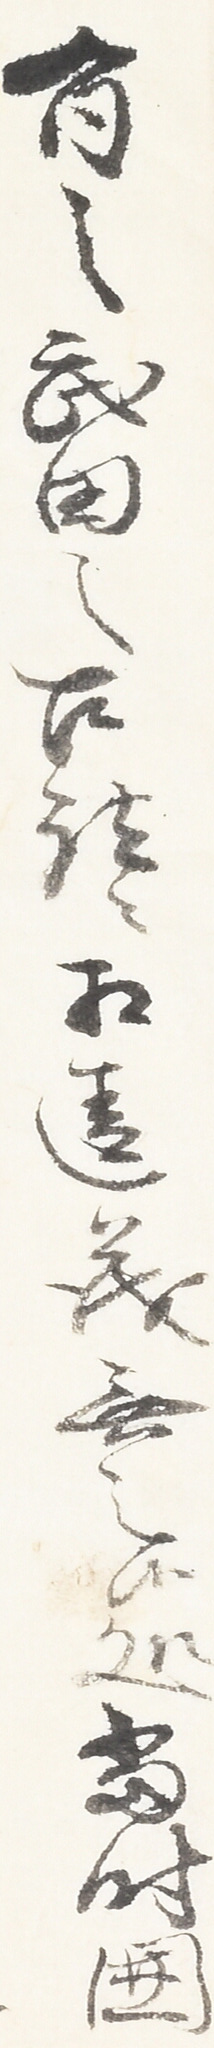有之武田之古跡ニ相違も無之候処当時囲
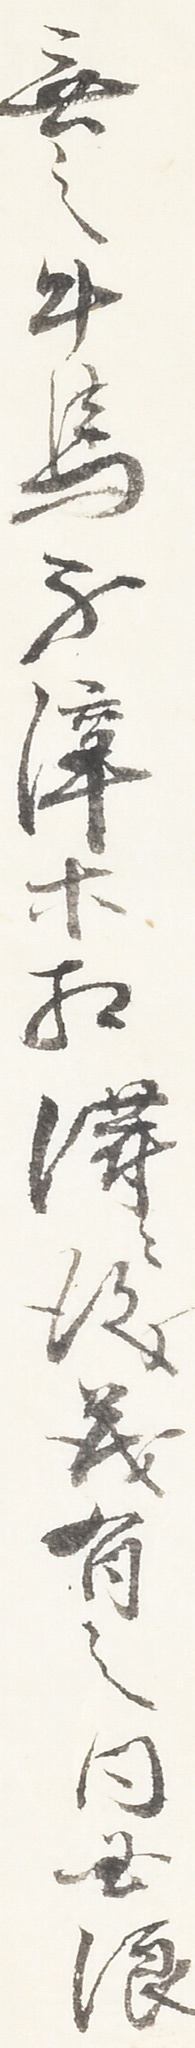無之牛馬不浄等相灌候儀も有之同国浪
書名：岩窪廟取（所）墓碑囲石垣取建伺書
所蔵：伊那市立高遠町図書館・合同会社AMANE
